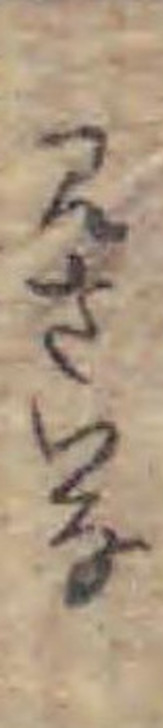見さいな
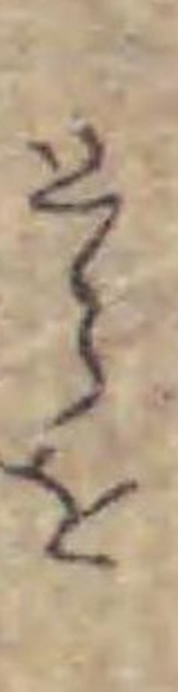とらを
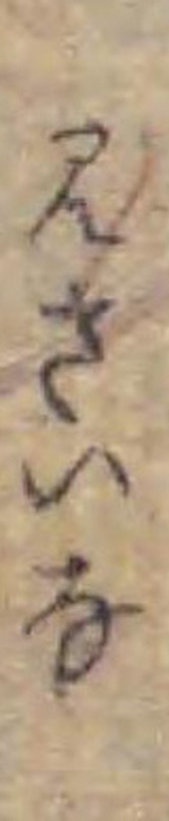見さいな
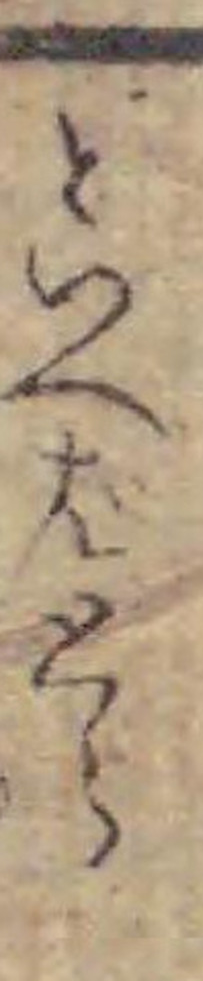といへばとら
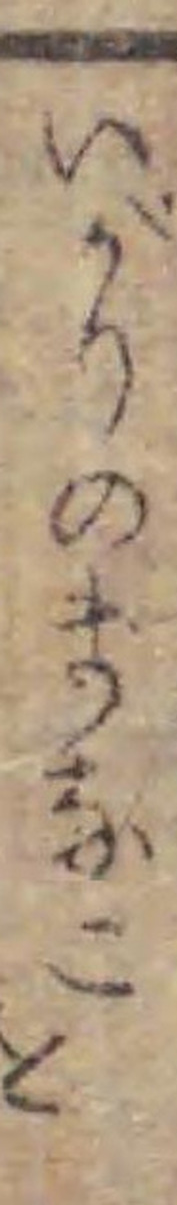いかりのまなこを
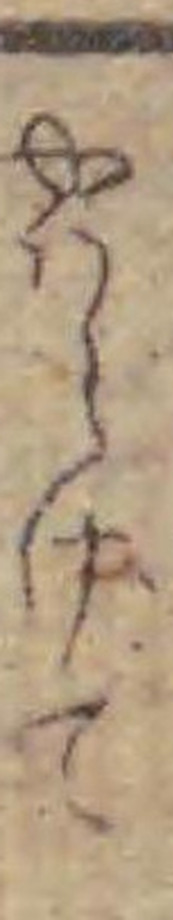やはらげて
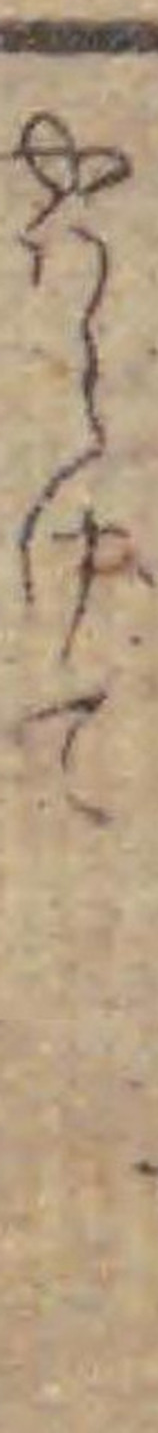やはらげて
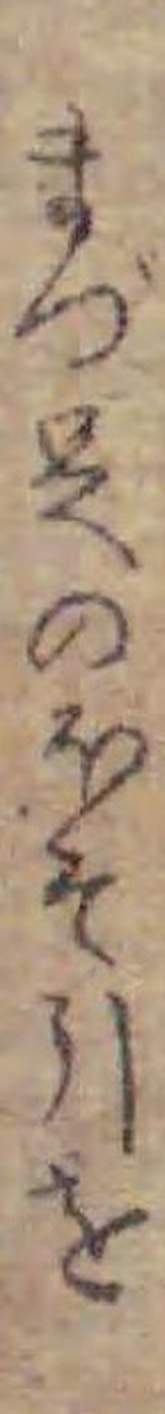まづ足のほそ引を
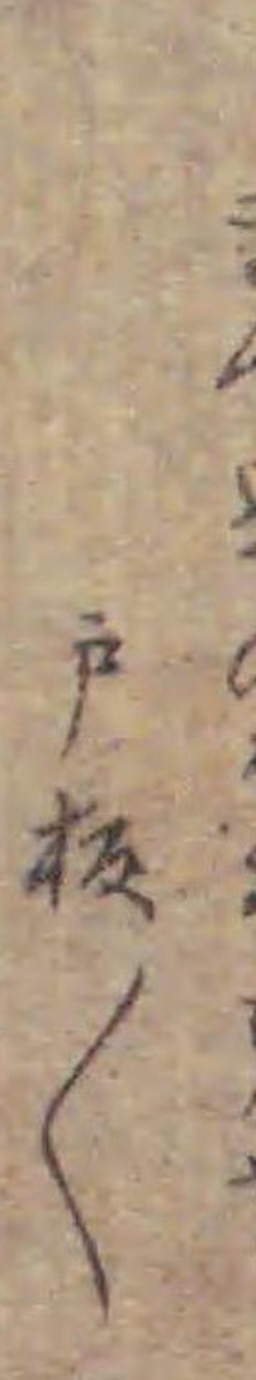戸板〳〵
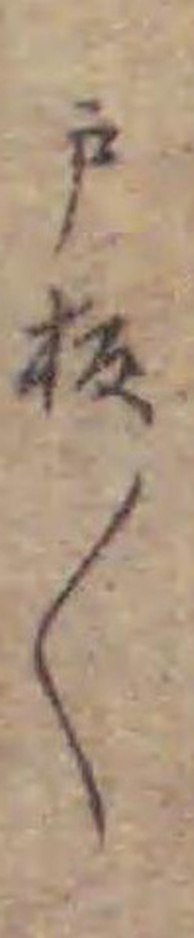戸板〳〵

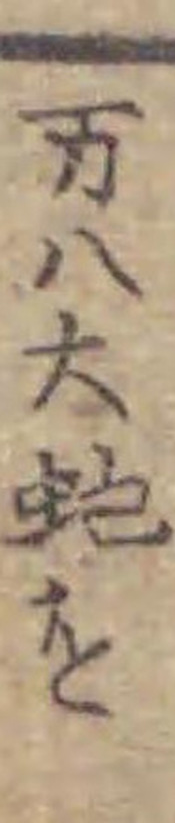万八大蛇を
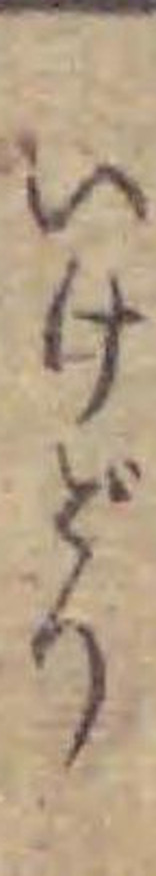いけどり
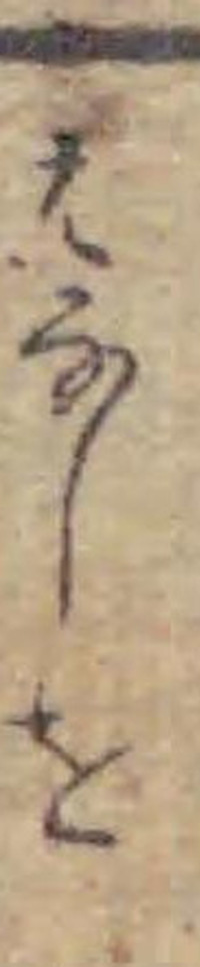はなしを
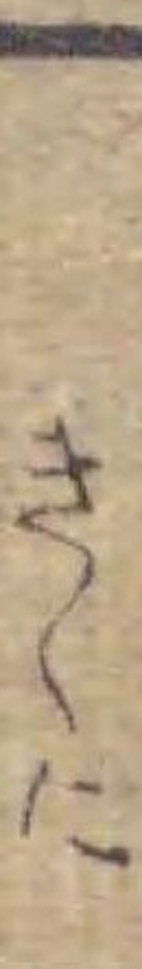きくに
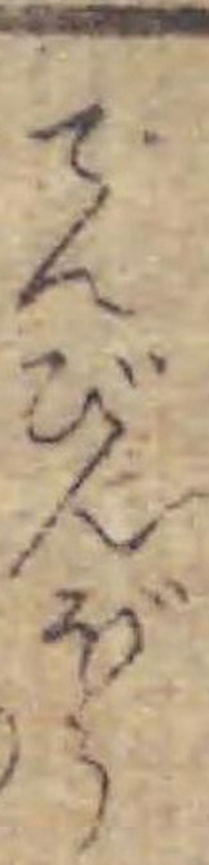てんびんぼう
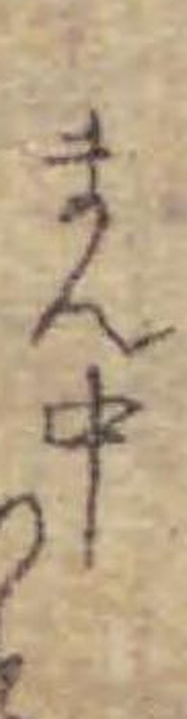まん中
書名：虚言八百万八伝 : 3巻
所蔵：国立国会図書館 National Diet Library, JAPAN
